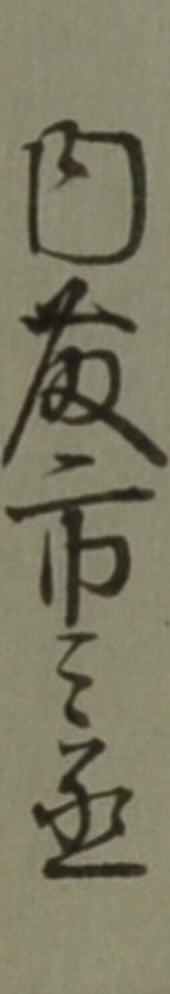内藤市之丞
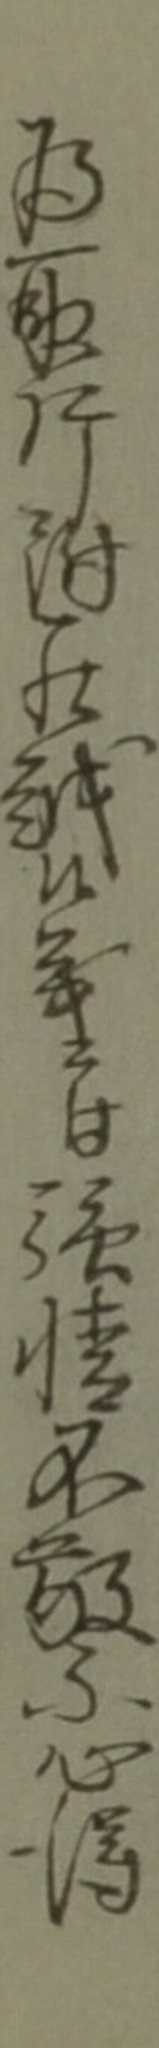為取片附罷越候義ニ付強情不敬不心得
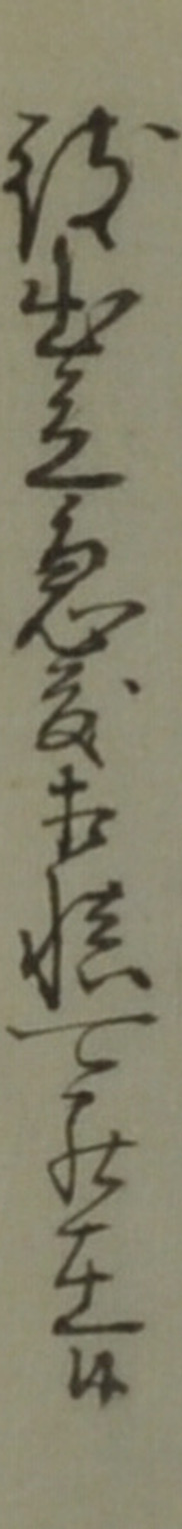致出立急度相慎可罷在候
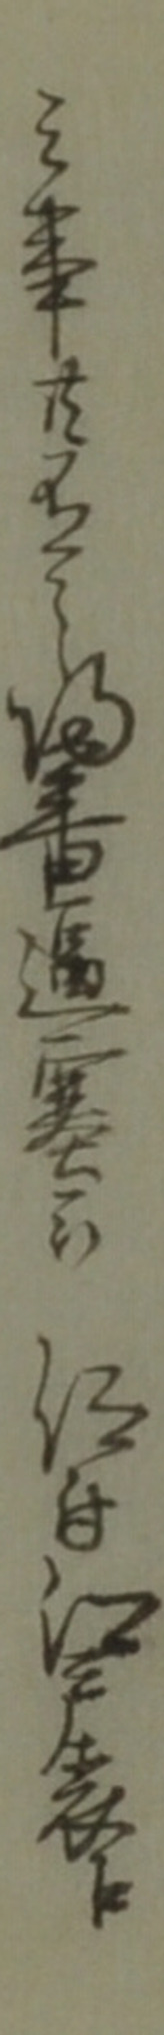之事共有之帰番逼塞被仰付江戸表江
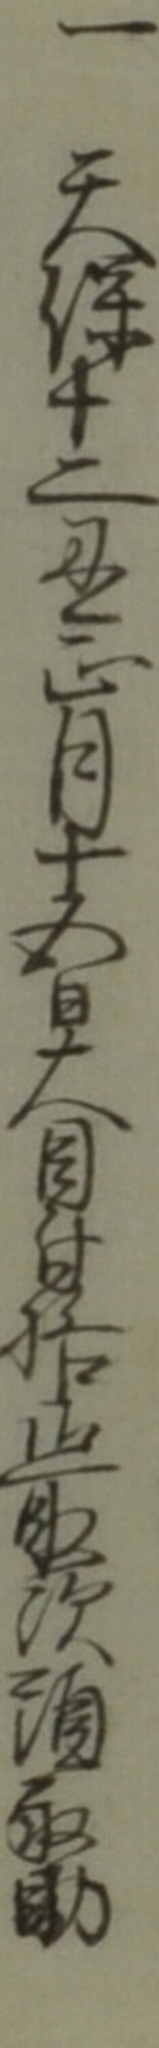一天保十二丑正月十五日大目付格御取次頭取助
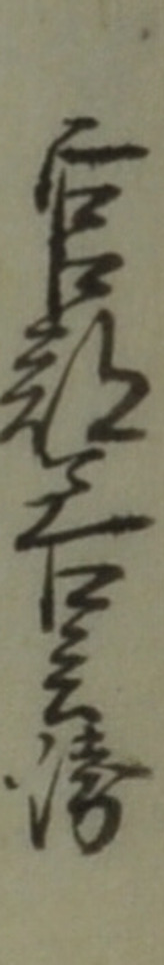官部善兵衛
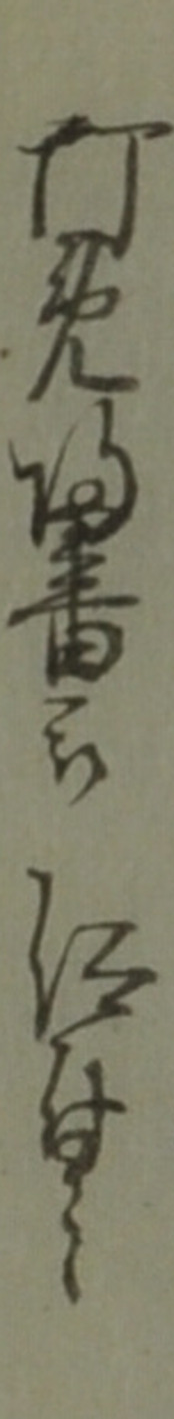御免帰番被仰付之
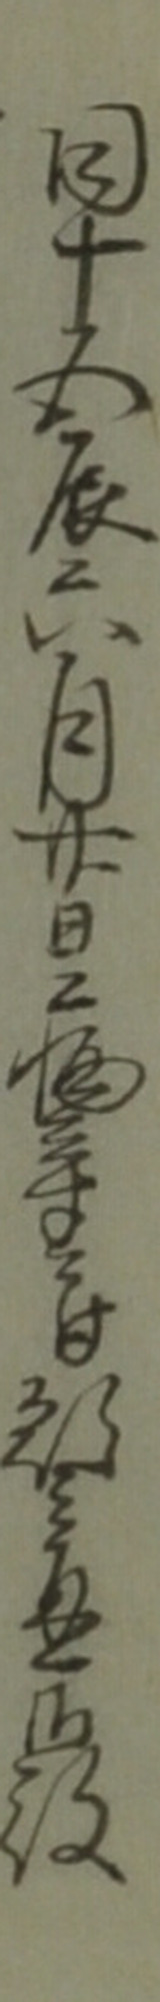一同十五辰六月廿日病気ニ付願之通御役
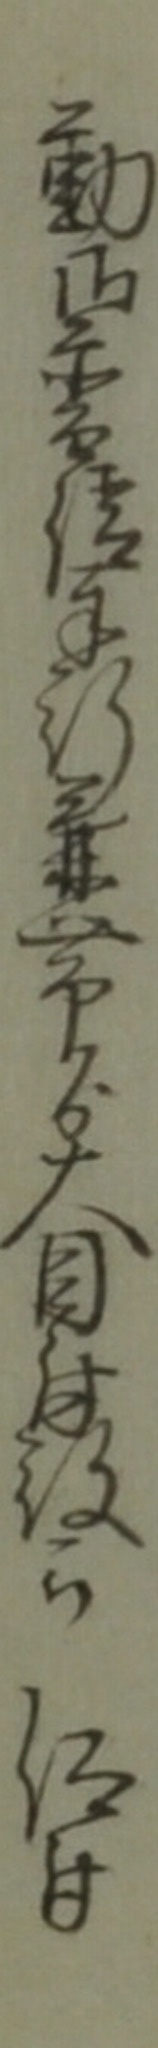勤御普請奉行兼帯ゟ大目付役被仰付
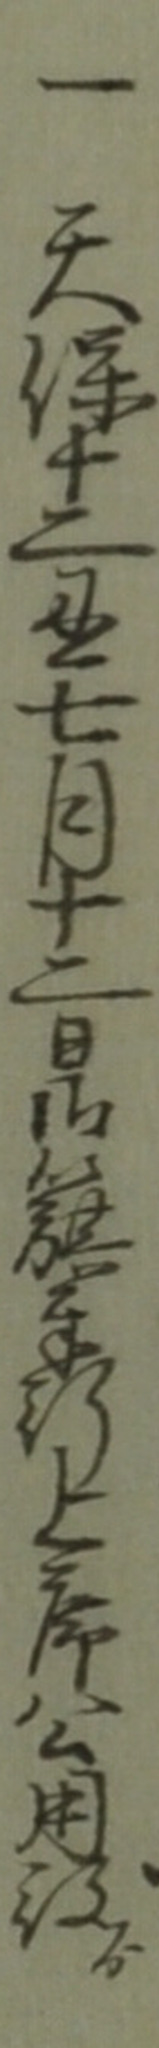一天保十二丑七月十二日御籏奉行上席公用役
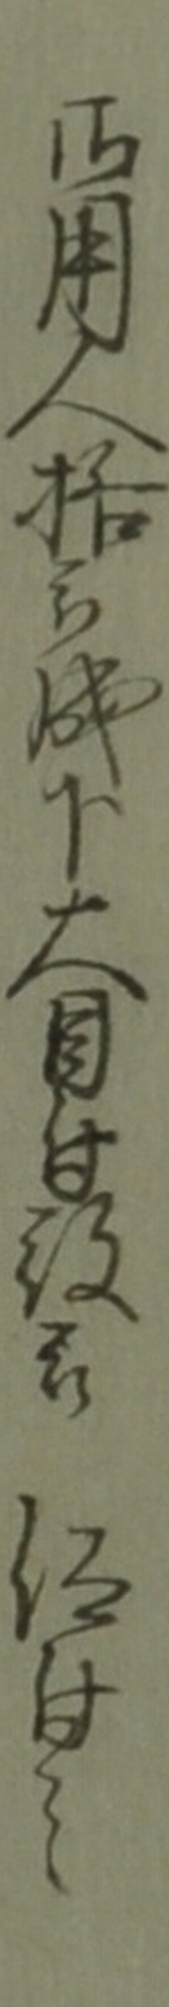御用人格被成下大目付役被仰付之
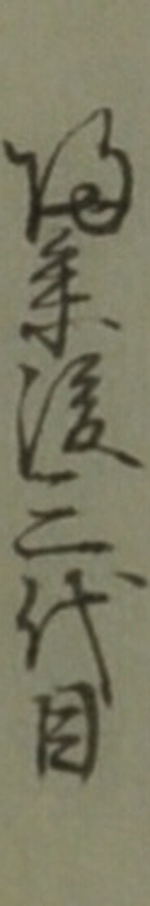帰参後二代目
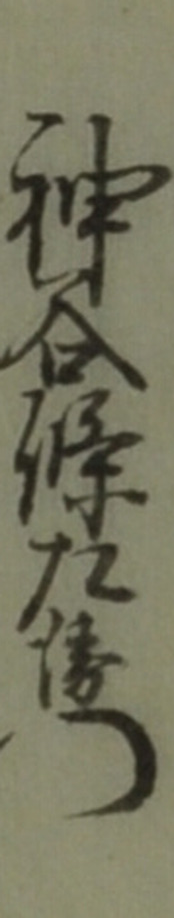神谷條左衛門
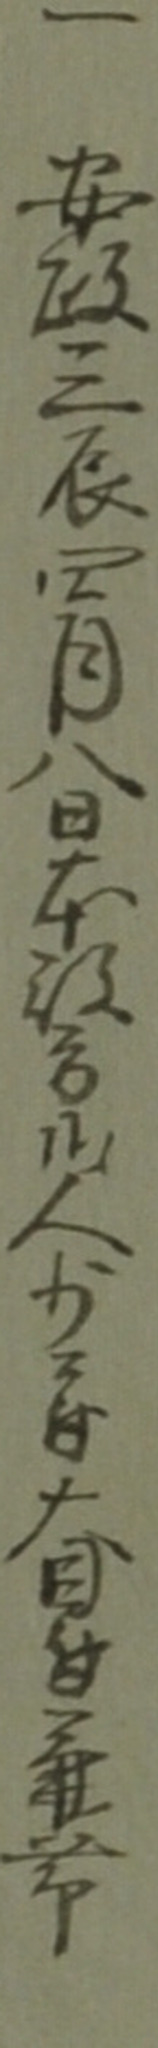一安政三辰四月八日本役方御人少ニ付大目付兼帯
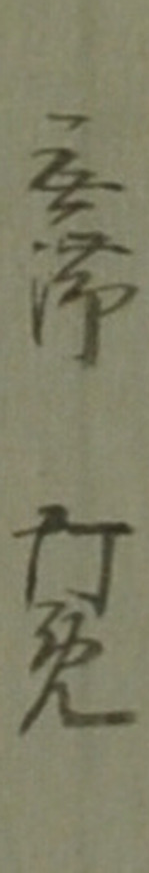無滞御免
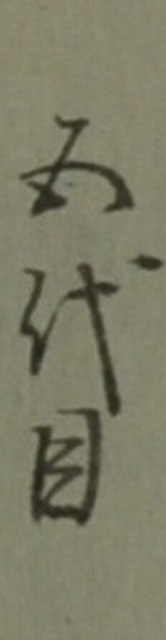五代目
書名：諸御役代々録（三）
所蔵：伊那市立高遠町図書館・合同会社AMANE
